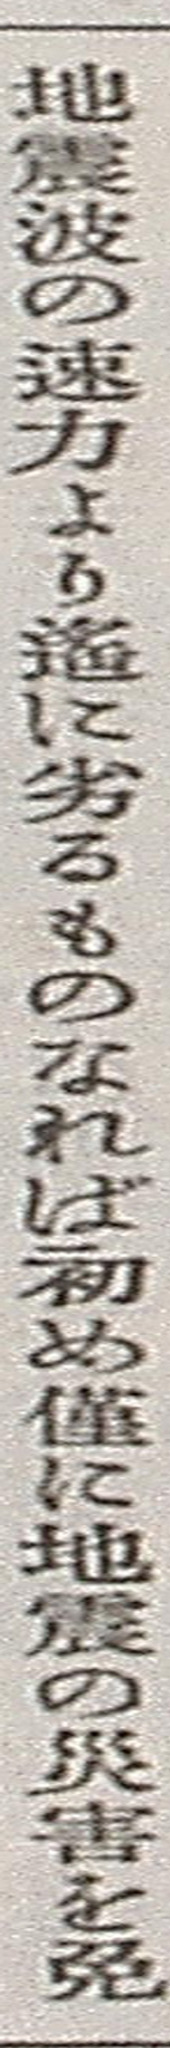地震波の速力より遙に劣るものなれば初め僅に地震の災害を免
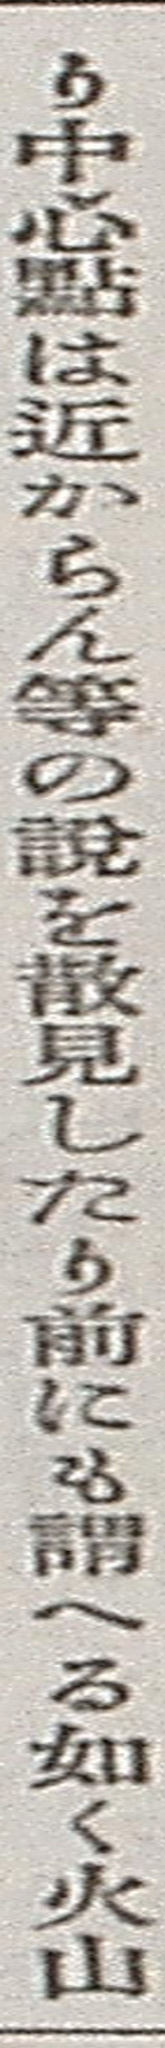り中心点は近からん等の説を散見したり前にも謂へる如く火山
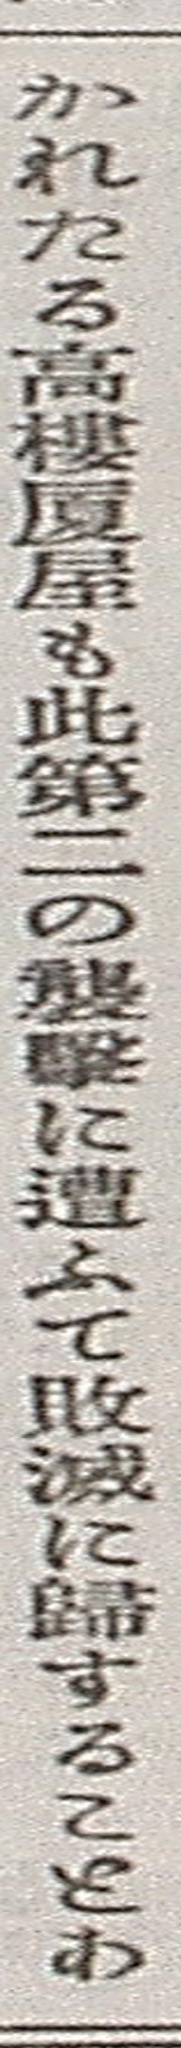かれたる高樓厦屋も此第二の襲撃に遭ふて敗滅に帰することあ
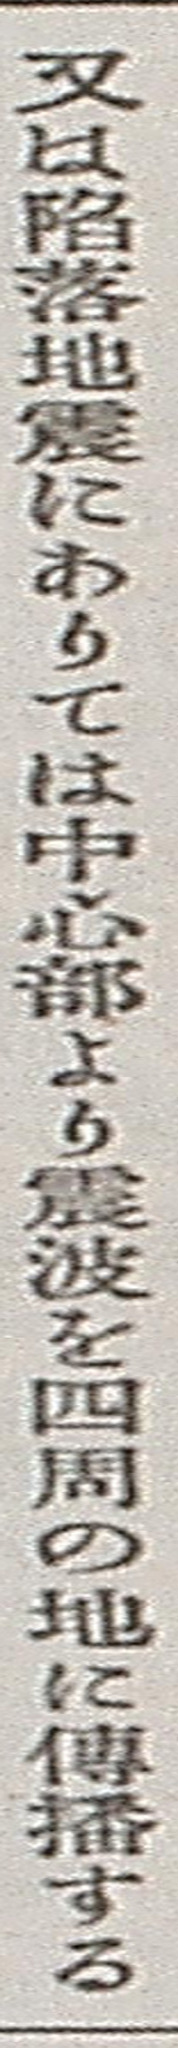又は陥落地震にありては中心部より震波を四周の地に伝播する
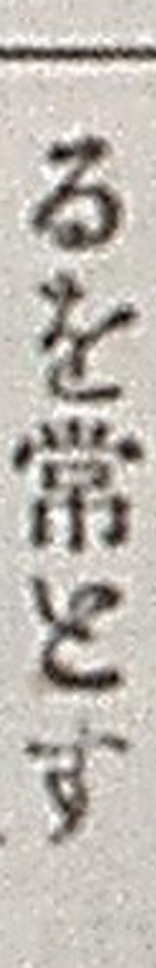るを常とす
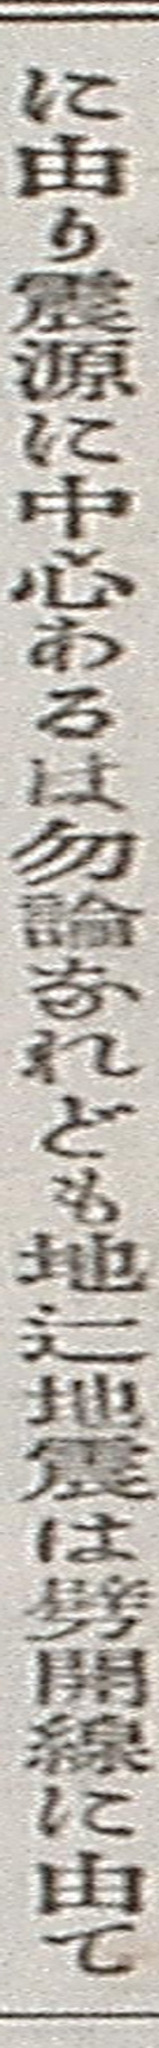に由り震源に中心あるは勿論なれども地辷地震は劈開線に由て
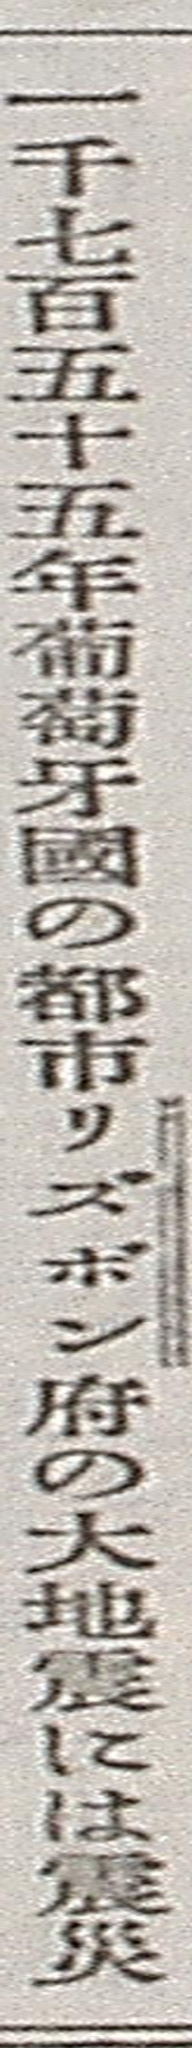一千七百五十五年葡萄牙国の都市リズボン府の大地震には震災
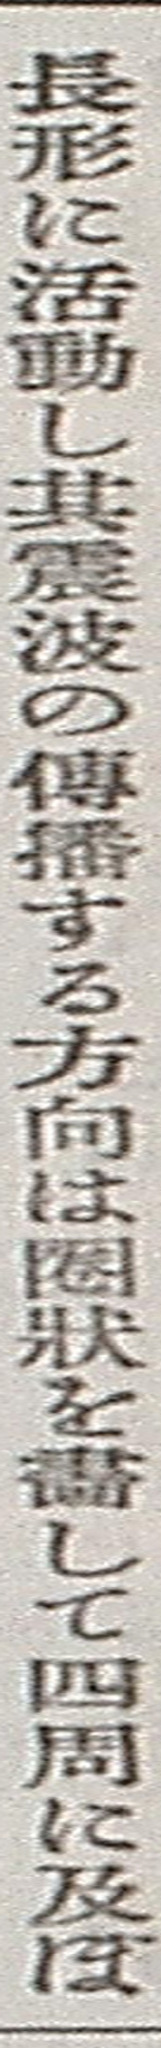長形に活動し其震波の伝播する方向は圏状を画して四周に及ぼ
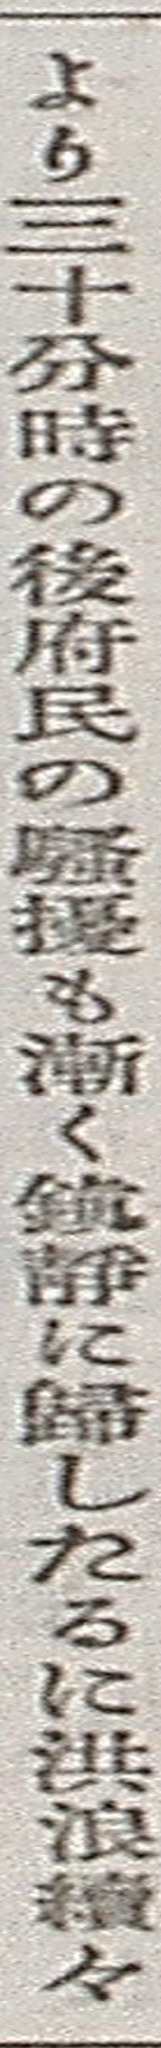より三十分時の後府民の騒擾も漸く鎮静に帰したるに洪浪続々
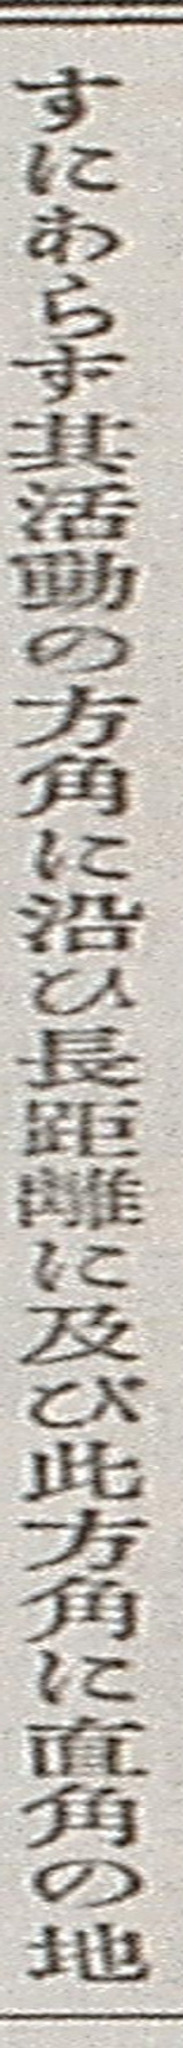すにあらず其活動の方角に沿ひ長距離に及び此方角に直角の地
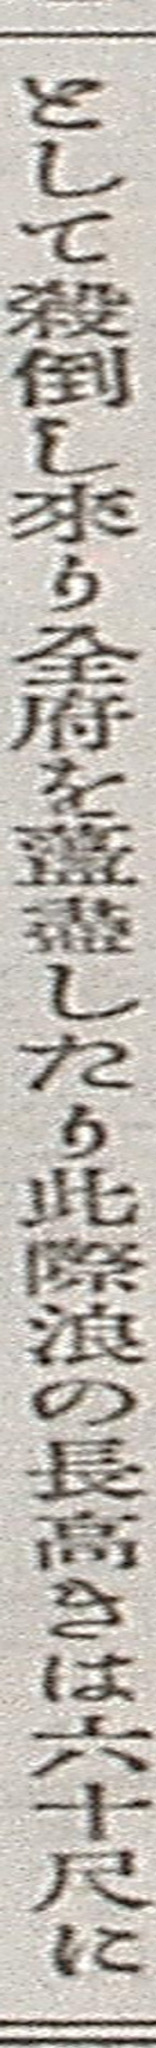として殺到し来り全府を蕩尽したり此際浪の長高きは六十尺に
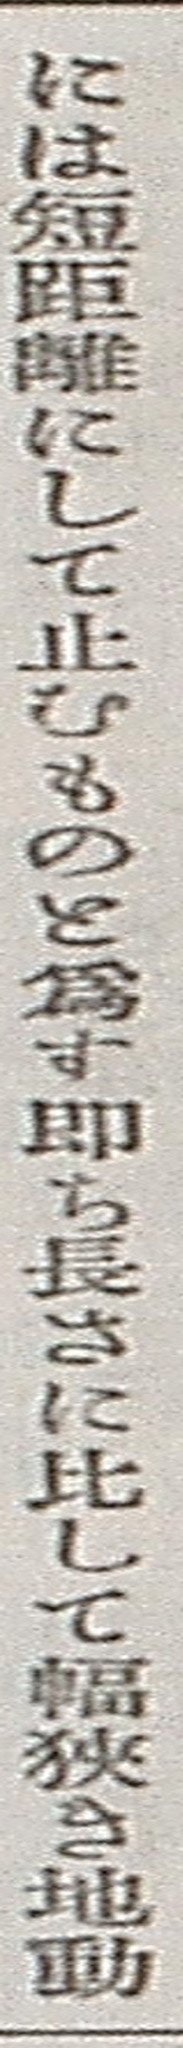には短距離にして止むものと為す即ち長さに比して幅狭き地動
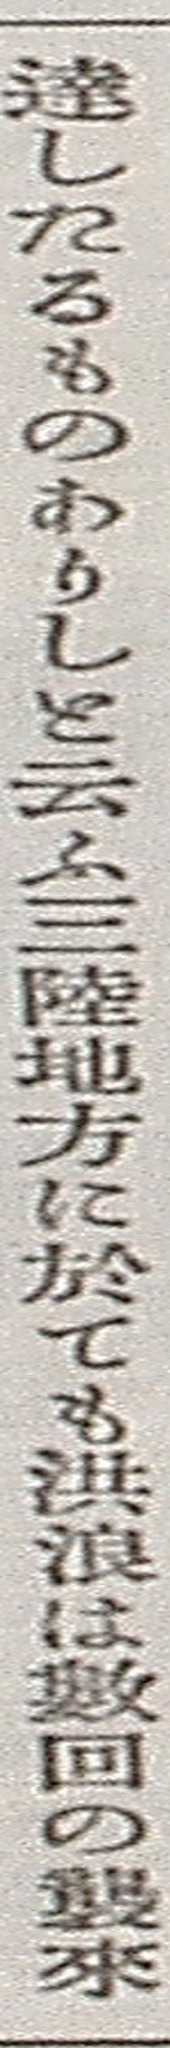達したるものありしと云ふ三陸地方に於ても洪浪は数回の襲来
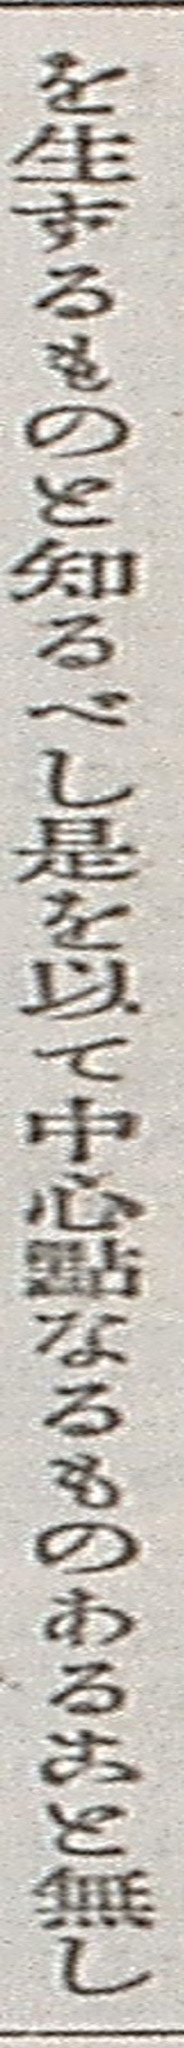を生ずるものと知るべし是を以て中心点なるものあること無し
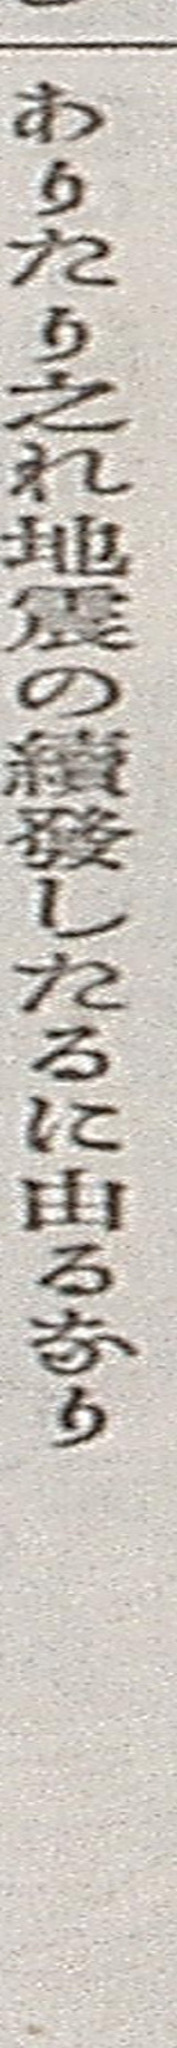ありたり之れ地震の続発したるに由るなり
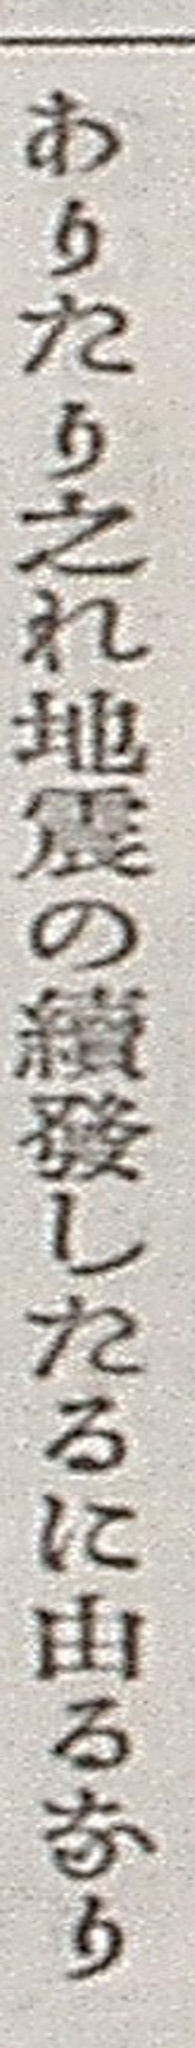ありたり之れ地震の続発したるに由るなり
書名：風俗畫報臨時増刊第百二十號　大海嘯被害録（下）
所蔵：東京大学地震研究所図書室 Earthquake Research Institute Library, The University of Tokyo, JAPAN
